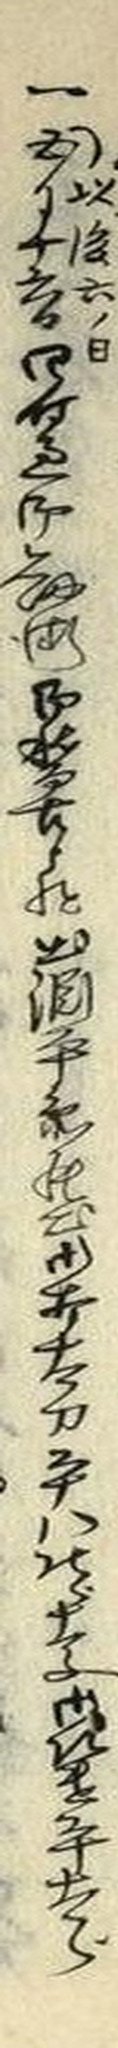一五月十六日以後六ノ日四時過御剣術御稽古被遊出淵平兵衛罷出御打太刀平八次郎太夫御次遣平太郎
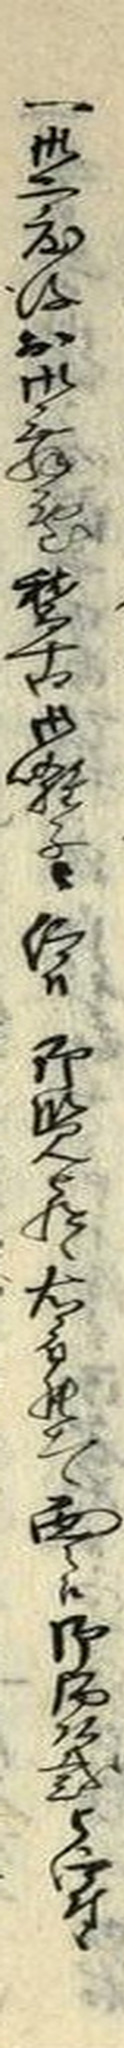一御二度後於御舞台稽古御囃子被仰付御覧被遊候右ニ付罷出候面々江御酒頂戴被仰付候
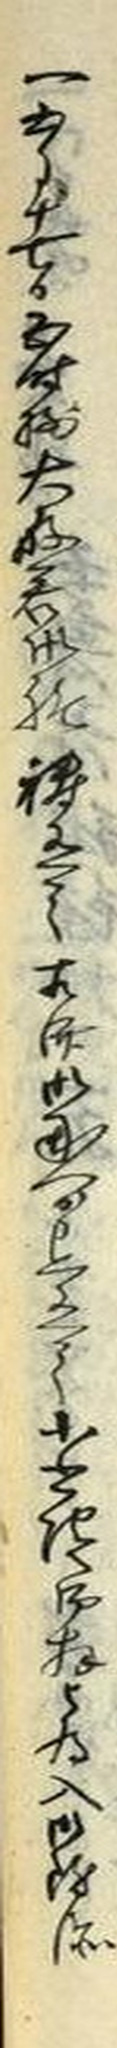一五月十七日五時揃大般若経御祈祷有之相済御用人ゟ申上有之小書院へ御拝被為入御附添
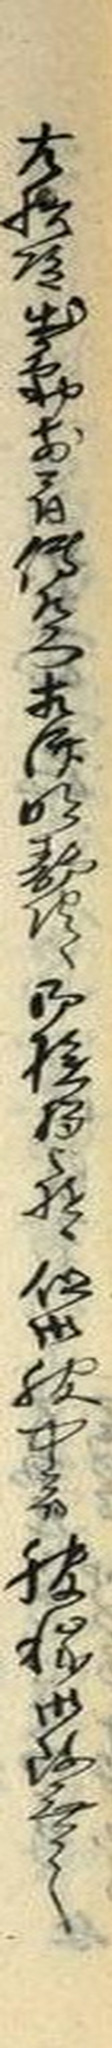左膳殿出勤前ニ付伝左衛門相済明静院へ御挨拶被遊候但御服中ニ付服穢御改無之
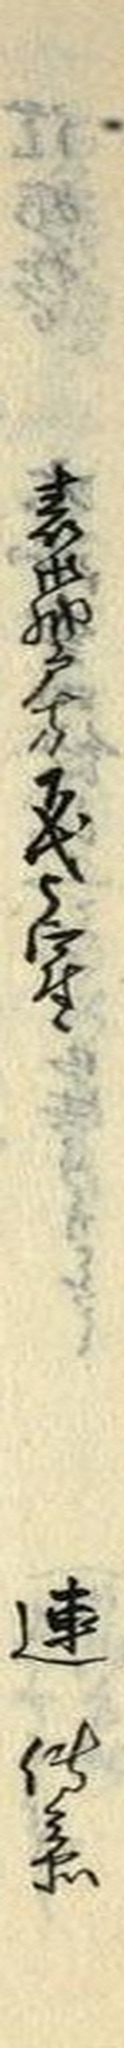表御納戸方下代被仰付候連伝兵衛
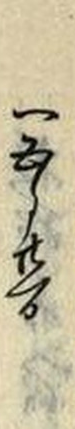一五月廿七日
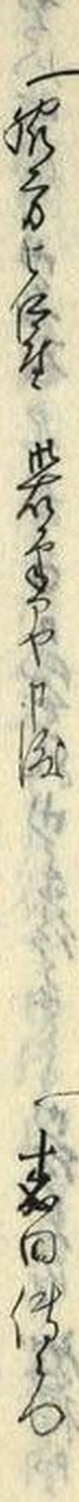脇方被仰付候御右筆部屋申渡森田伝右衛門
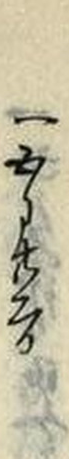一五月廿七日
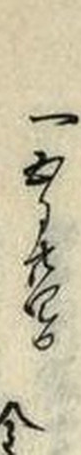一五月廿七日
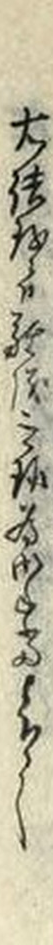右詰越ニ付難儀之趣為御手当被下之
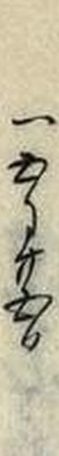一五月廿七日
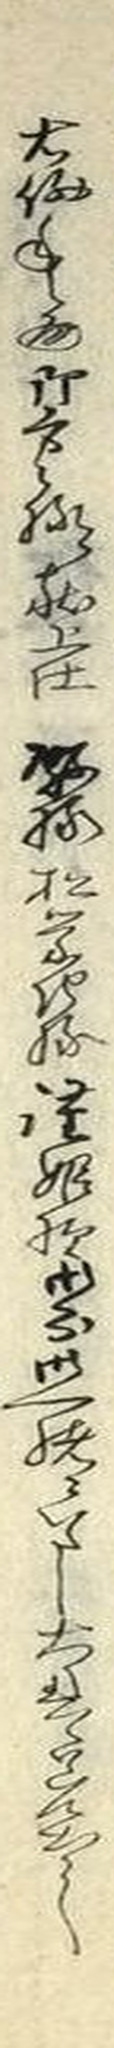右例年之通御方々様へ献上仕殿様松栄院様謹姫様御分御一緒ニいたし大奥へ差出之
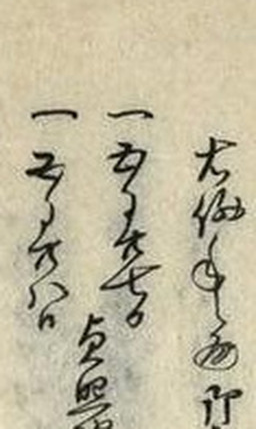一五月廿七日
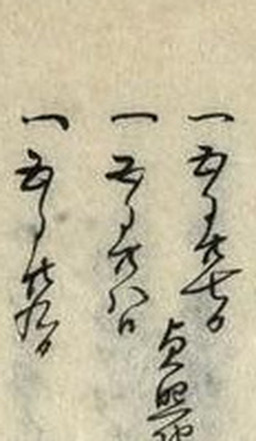一五月廿七日
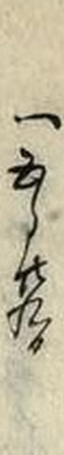一五月廿七日
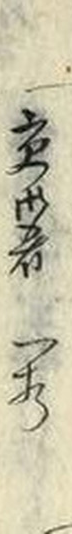交御肴一折
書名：少傅日録抄（斉善付側向頭取日記、在府）
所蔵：福井県文書館 Fukui Prefectural Archives
